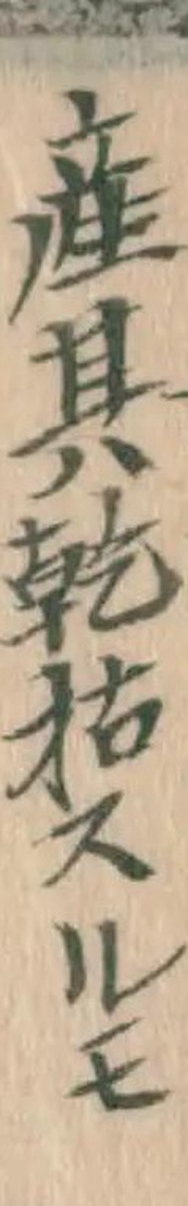産其乾枯スルモ
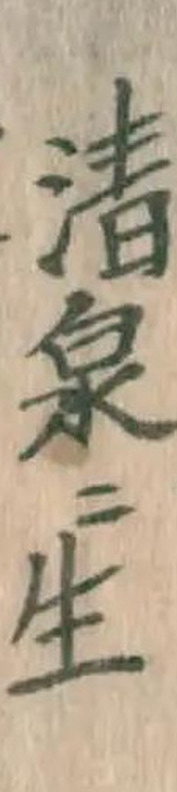清泉ニ生
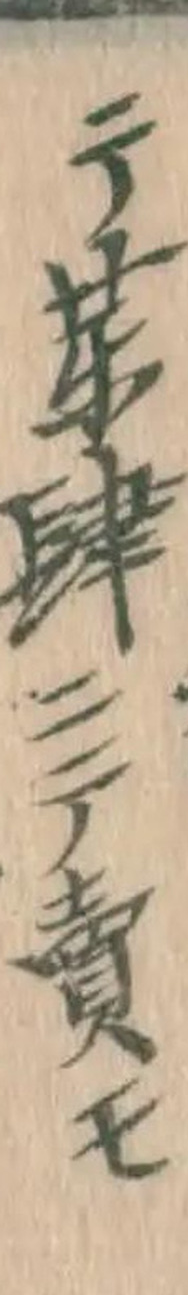テ薬肆ニテ賣モ
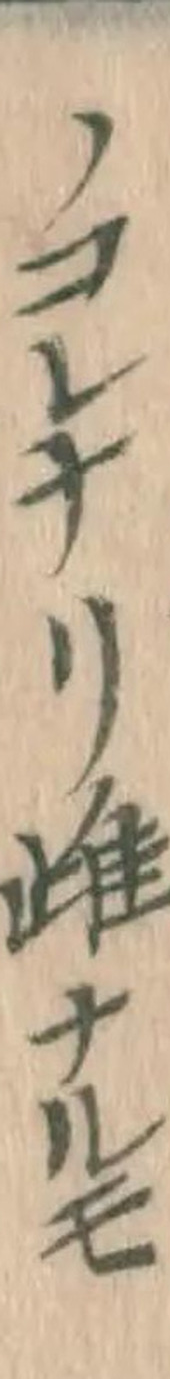ノコレナリ雌ナルモ
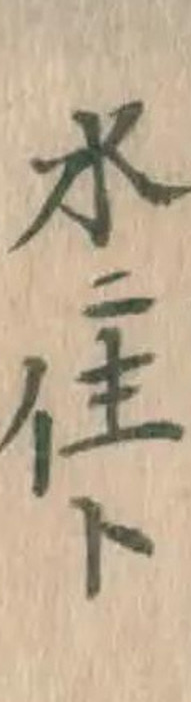水ニ住ト
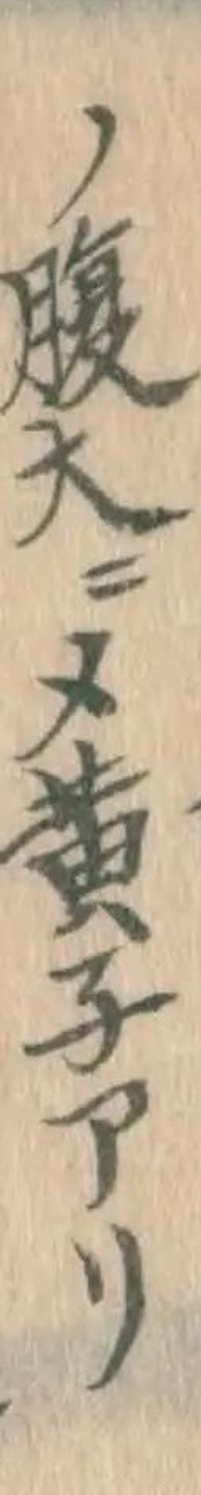ノ腹大ニシテ黄子アリ
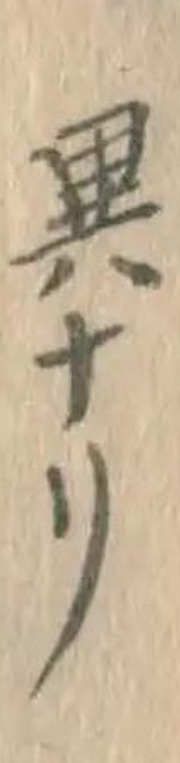異ナリ
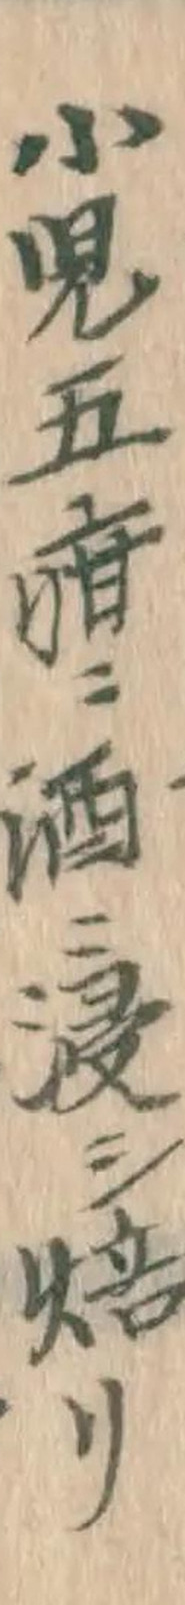小児五疳ニ酒ニ浸シ焙リ
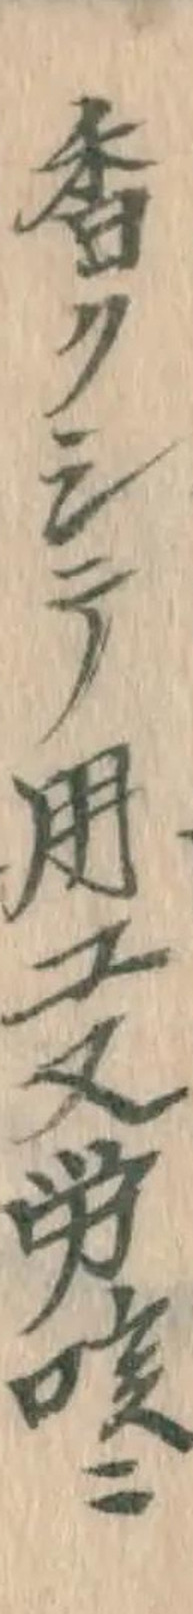香クシテ用ユ又労咳ニ
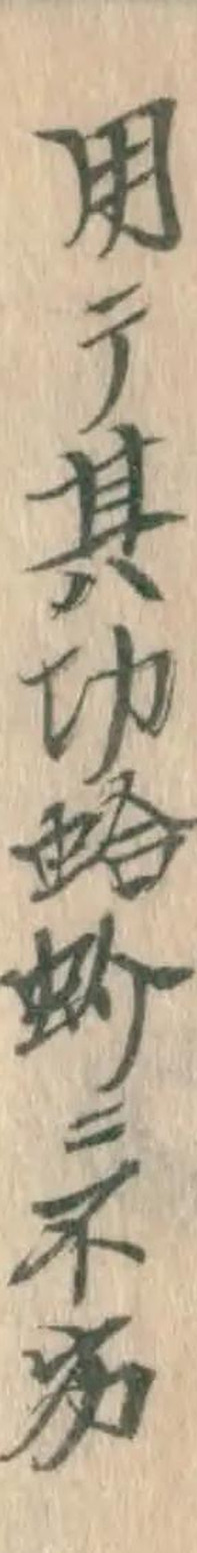用テ其功蛤蚧ニ不劣

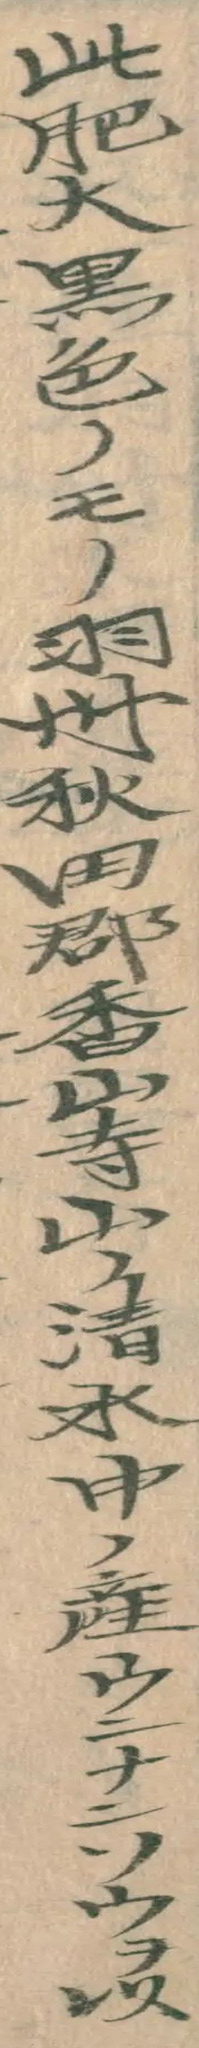此肥大黒色ノモノ羽州秋田郡香山寺山ノ清水中ノ産ウンナンソウヲ以
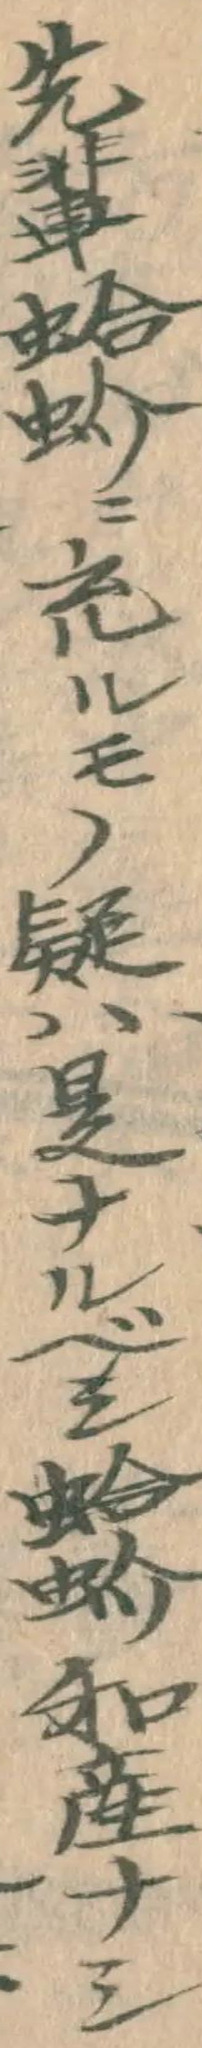先輩蛤蚧ニ充ルモノ疑ハ是ナルベシ蛤蚧和産ナシ
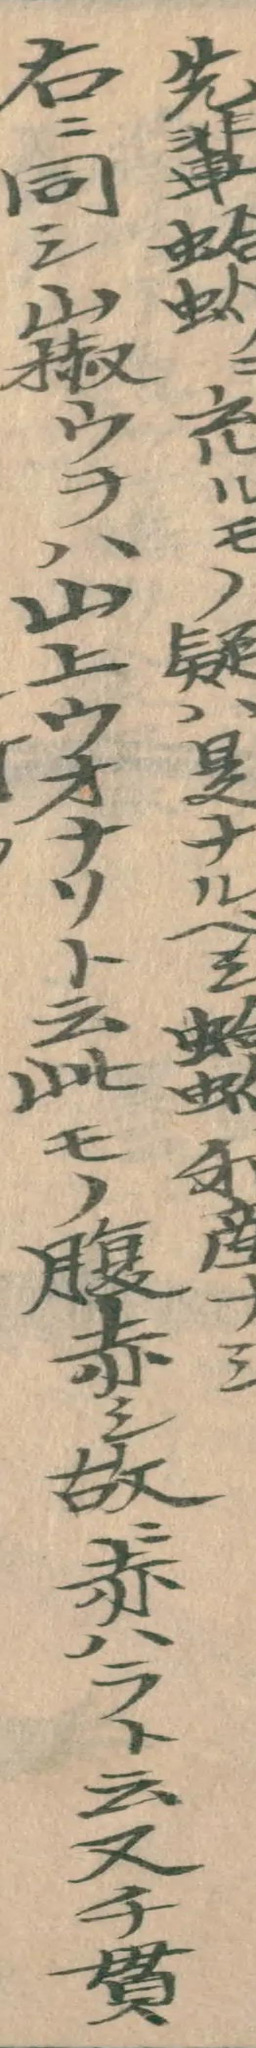右ニ同シ山椒ウヲハ山上ウオナリト云此モノ腹赤シ故ニ赤ハラト云又千貫
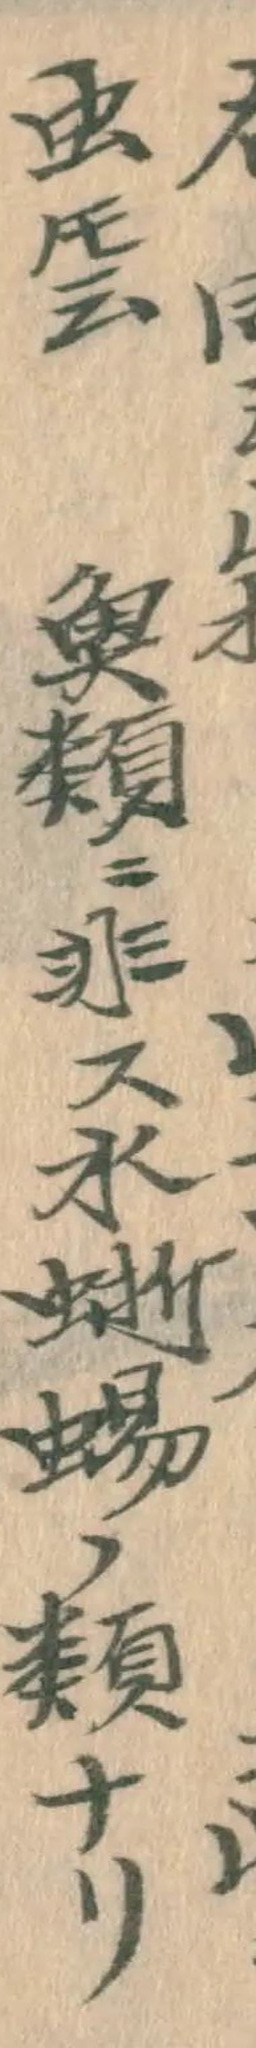虫トモ云魚類ニ非ス水蜥蜴ノ類ナリ
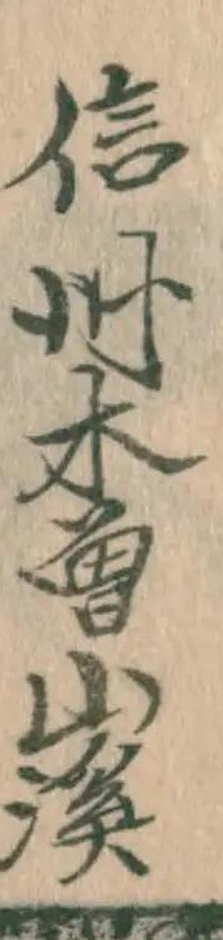信州木曽山渓
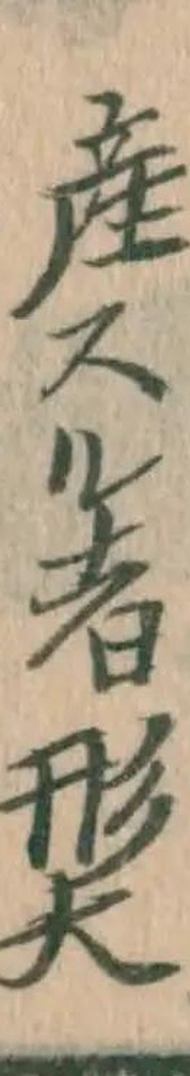産スル者形大
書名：千蟲譜 3巻. [1]
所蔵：国立国会図書館 National Diet Library, JAPAN
